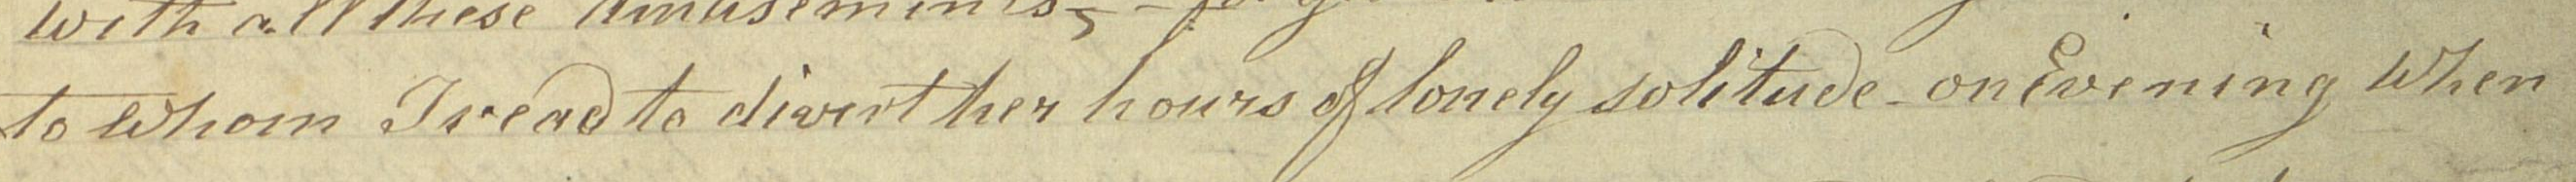to Whom I read to divert her hours of lonely solitude on Evening when
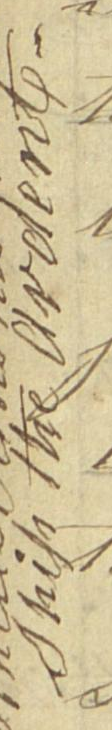Ship the Ardent
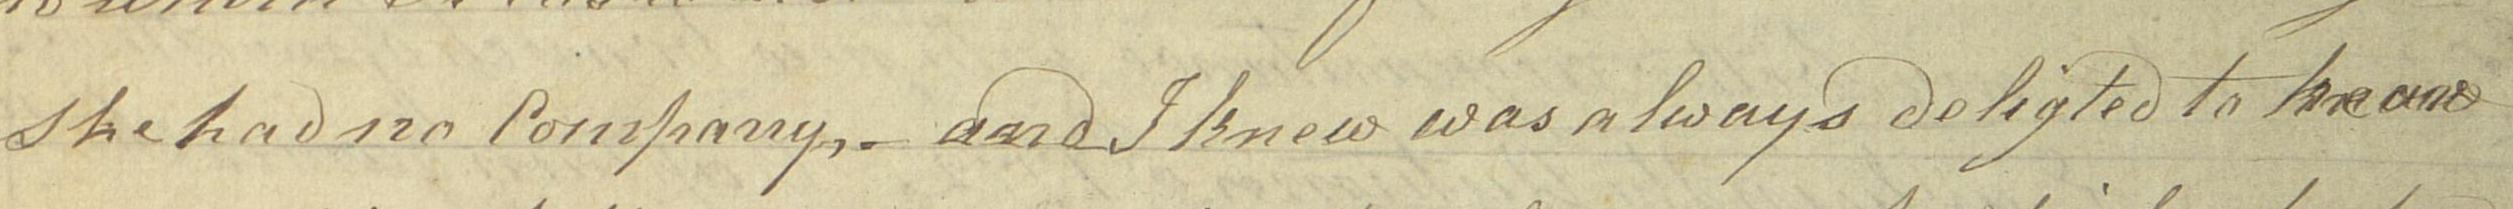she had no Company. and I knew was always deligted to know
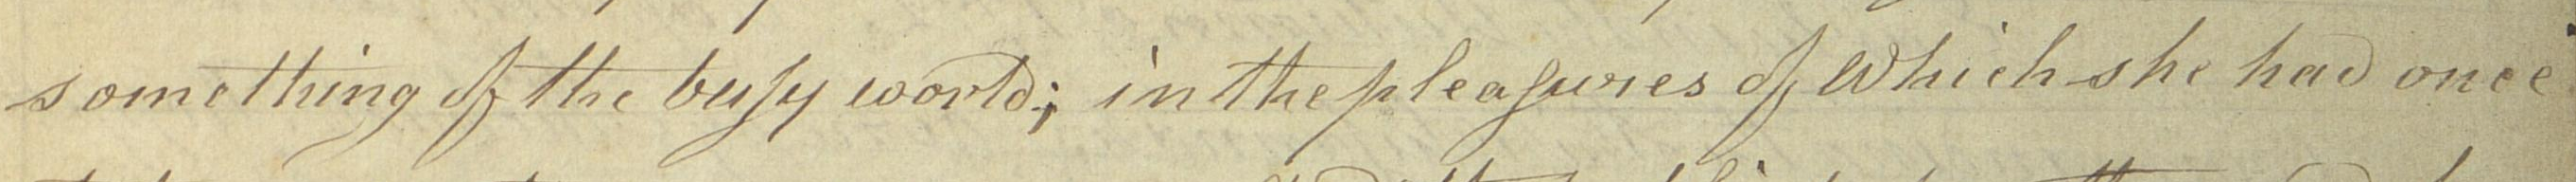something of the busy world; in the pleasures of Which she had once
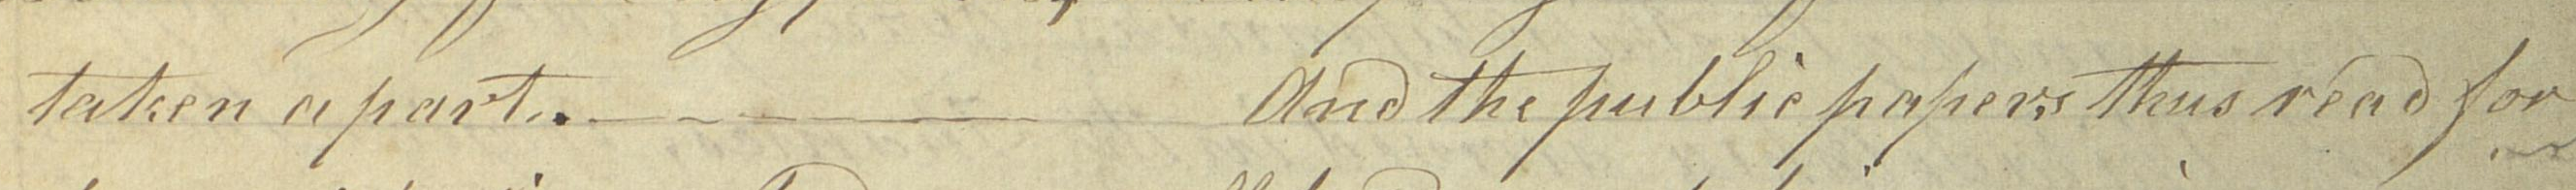taken apart. And the public papers thus read for
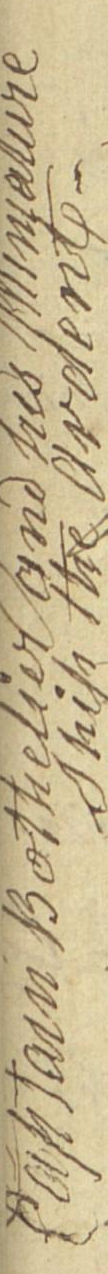Captain Bothelier and his Miniature
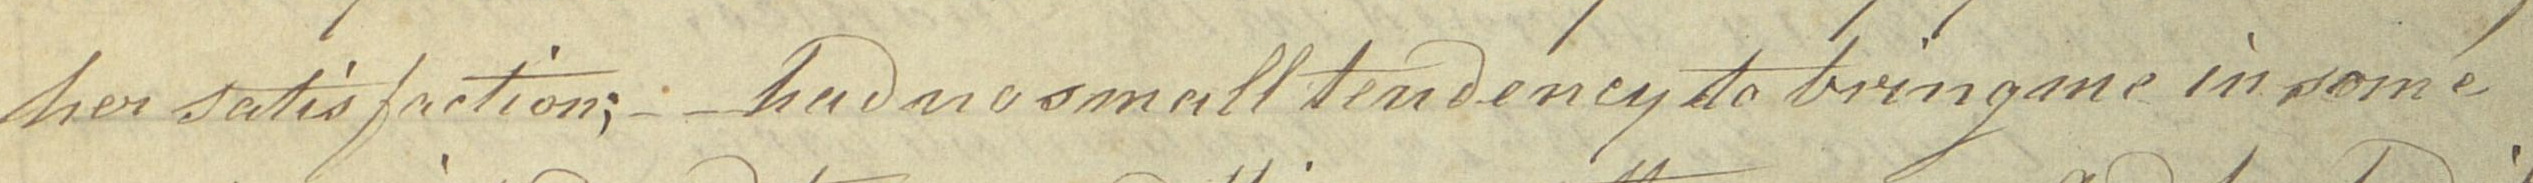her satisfaction; had no small tendency to bring me in some
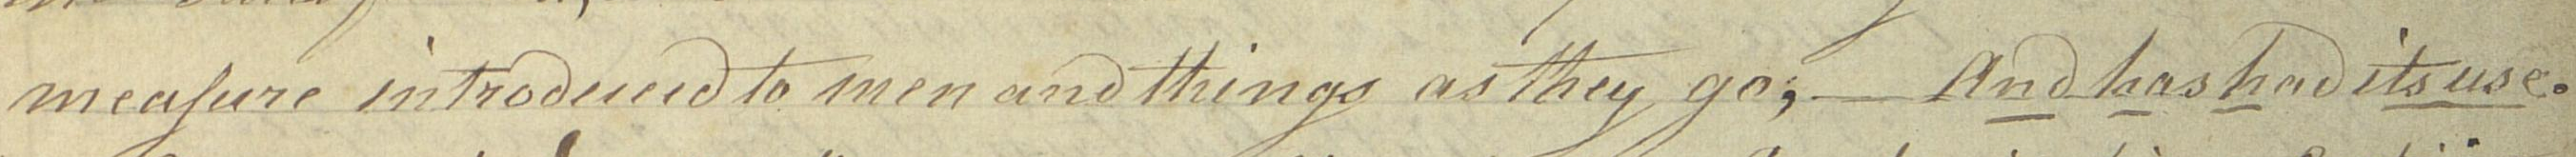measure introduced to men and things as they go, And has had its use.
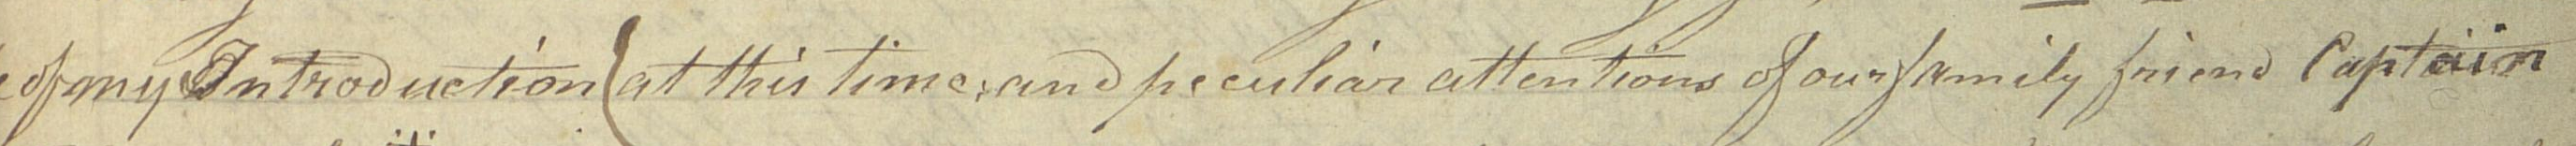of my Introduction (at this time, and peculiar attentions of our family friend Captain
